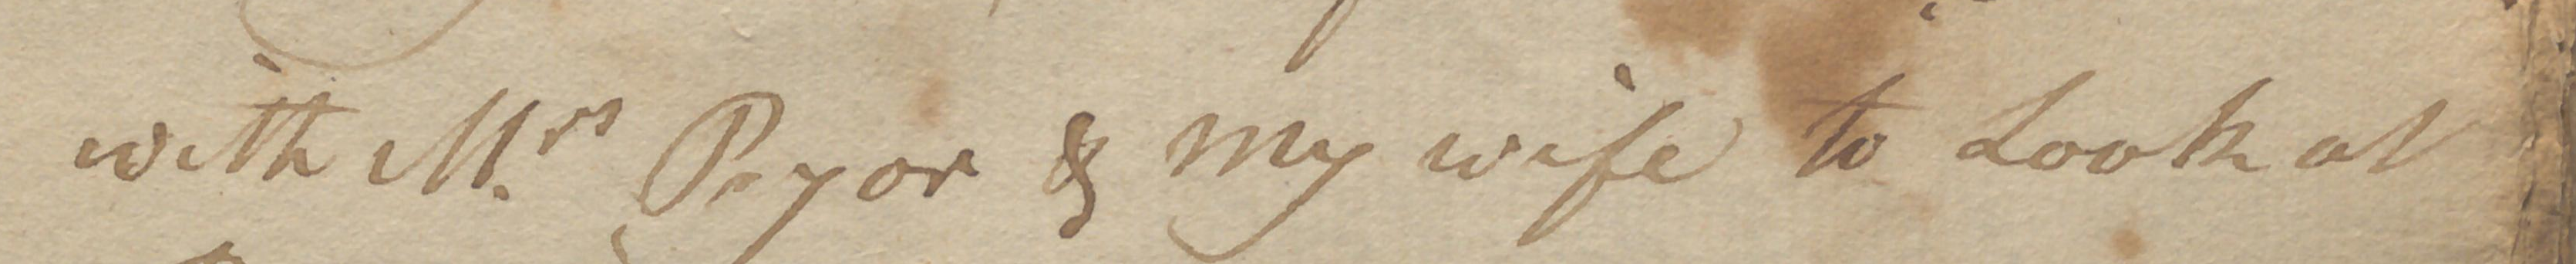with M^r. Pryor & My wife to Look at
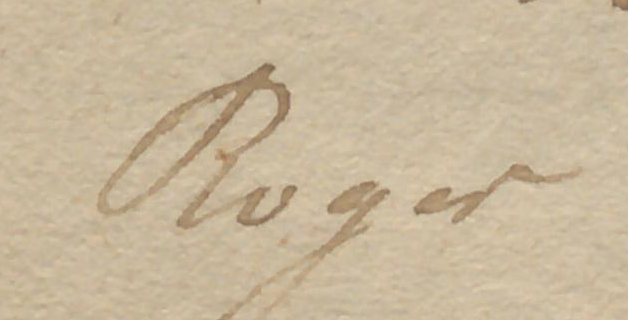Roger
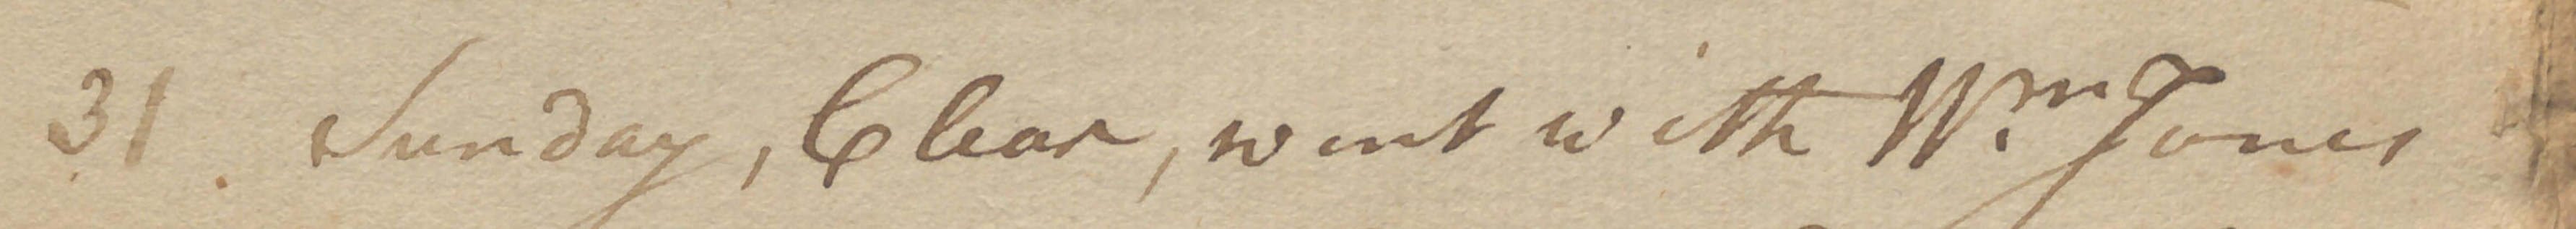31 Tunday, Clear, went with W^m. Jones
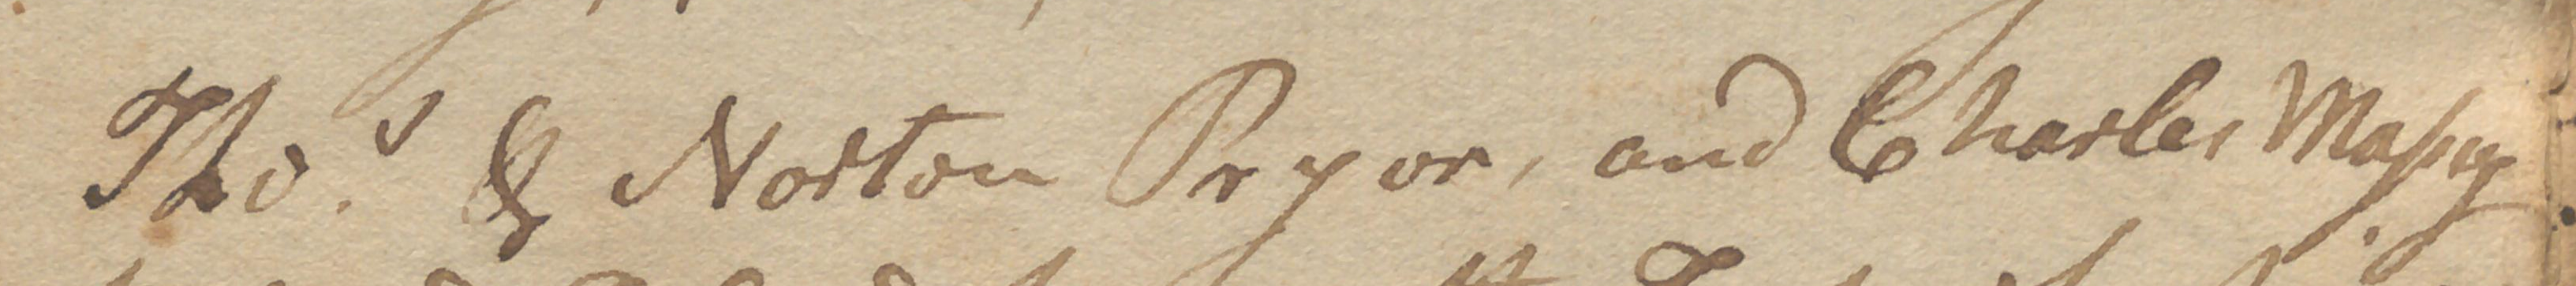Tho^s. & Norton Pryor, and Charles Massey
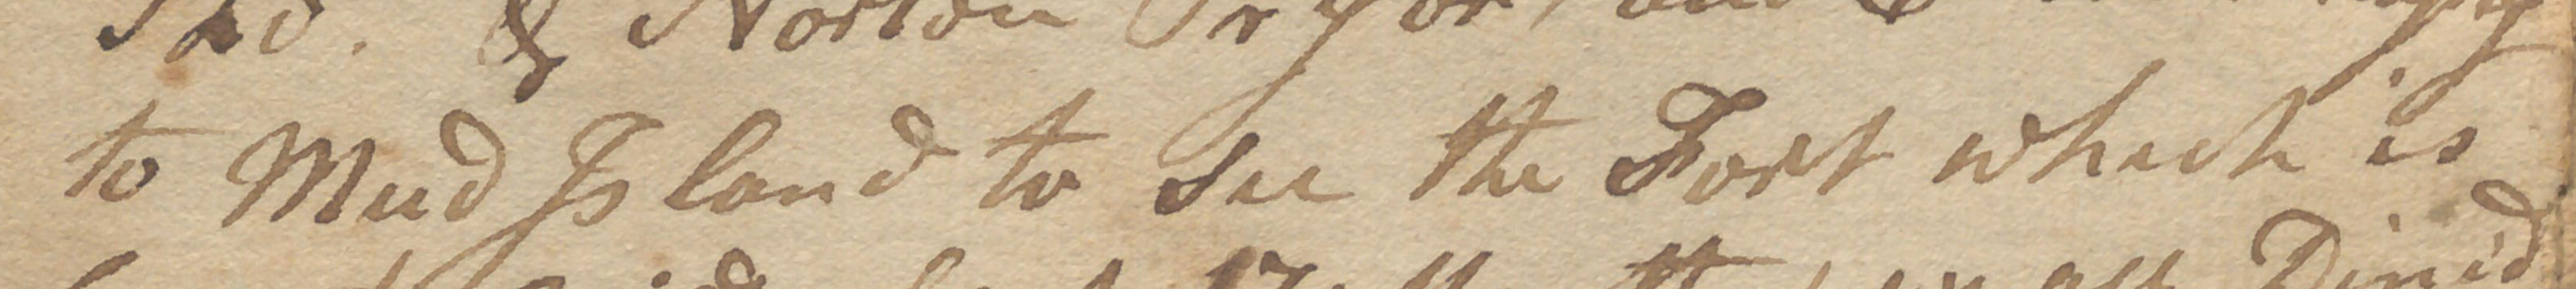to Mud Island to see the Fort which is
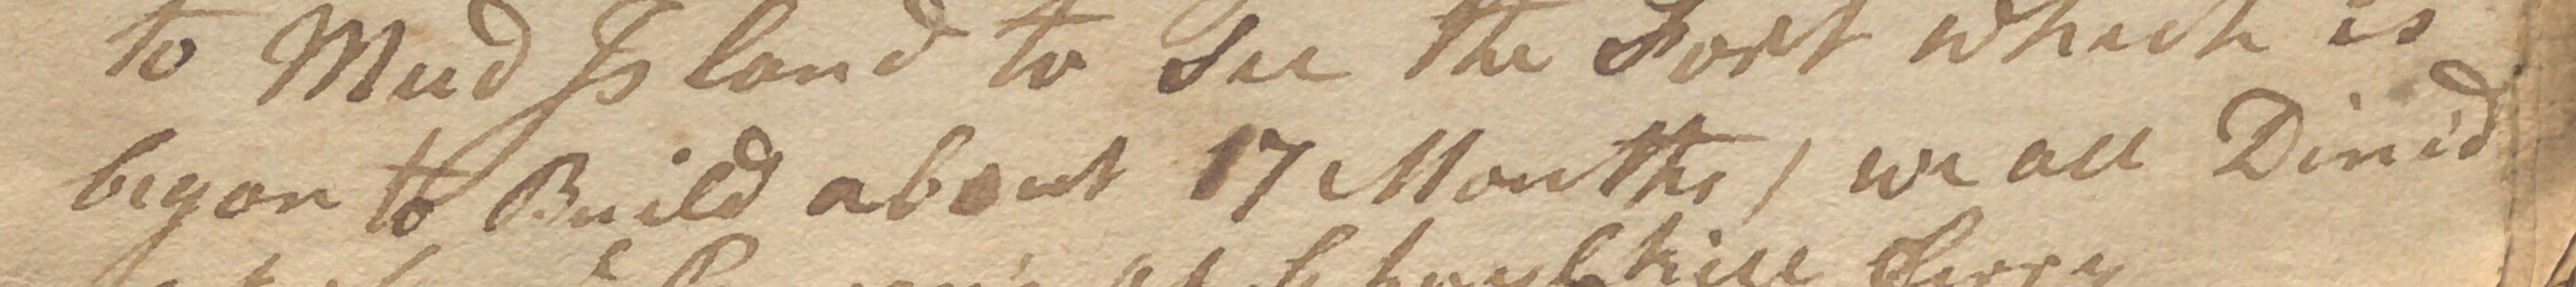begon to Build about 17 Months, we all Dined
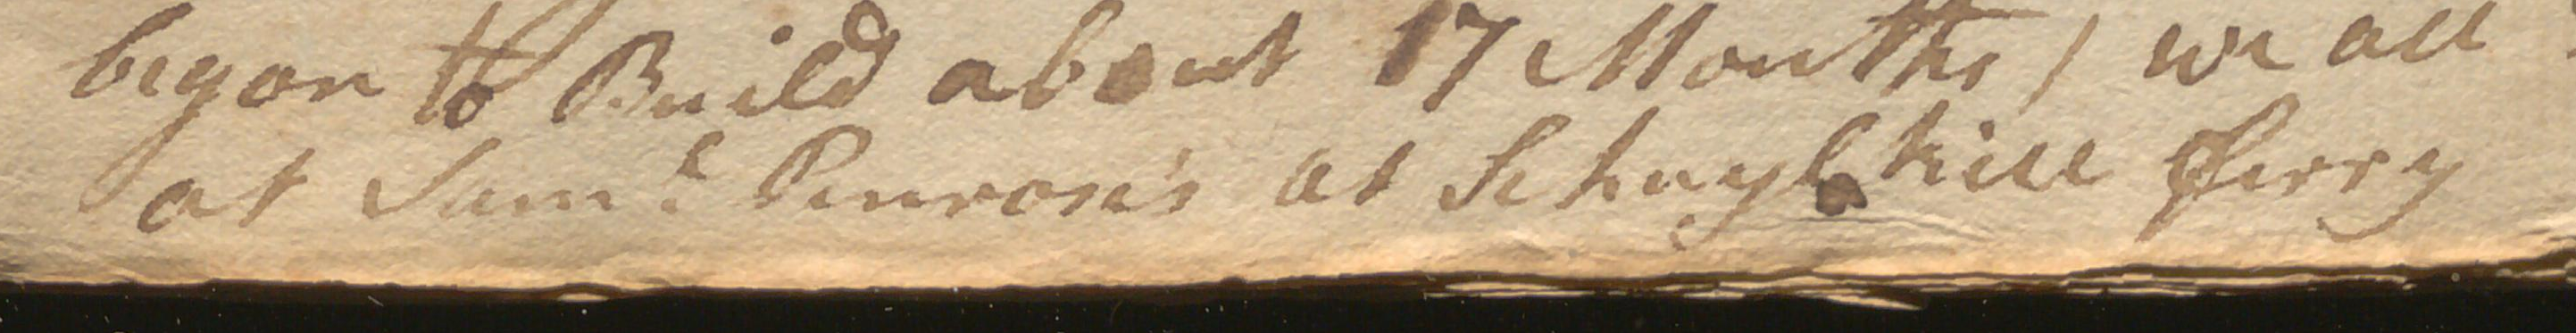at Sam^l Penroses at Schuylkill ferry
